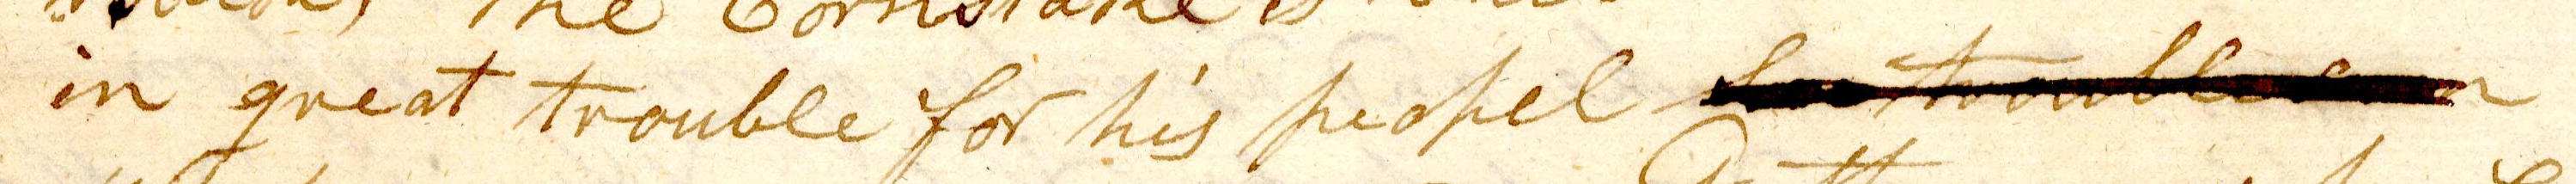in great trouble for his peopel [___] [trouble] [___]
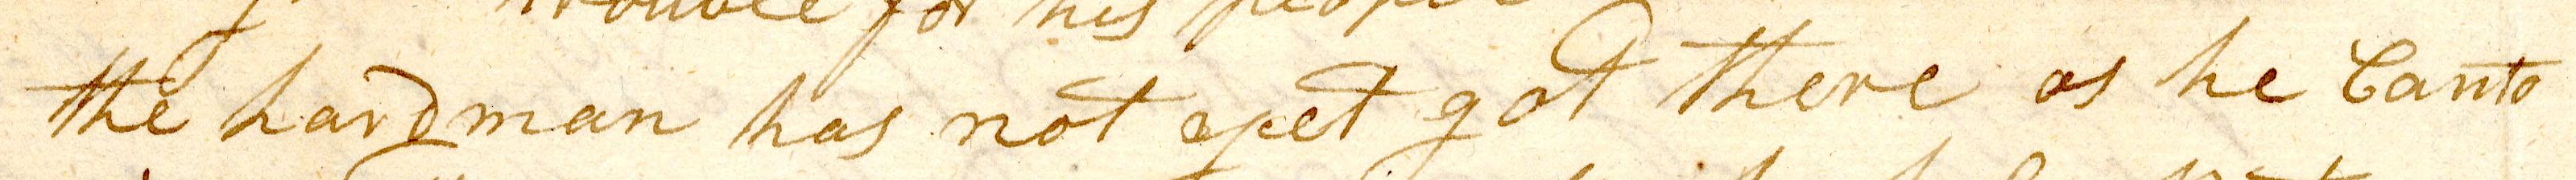the hard man has not yet got there as he Can to
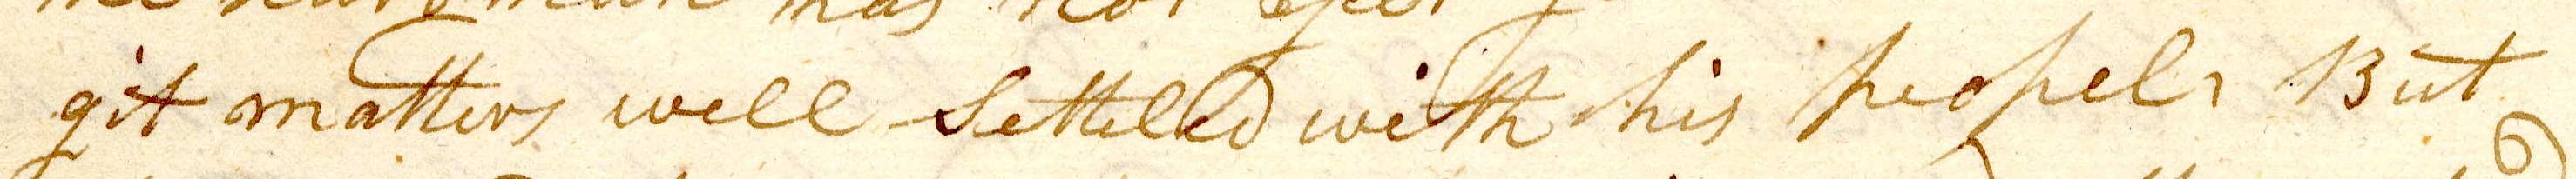git matters well setteled with his peopel, But
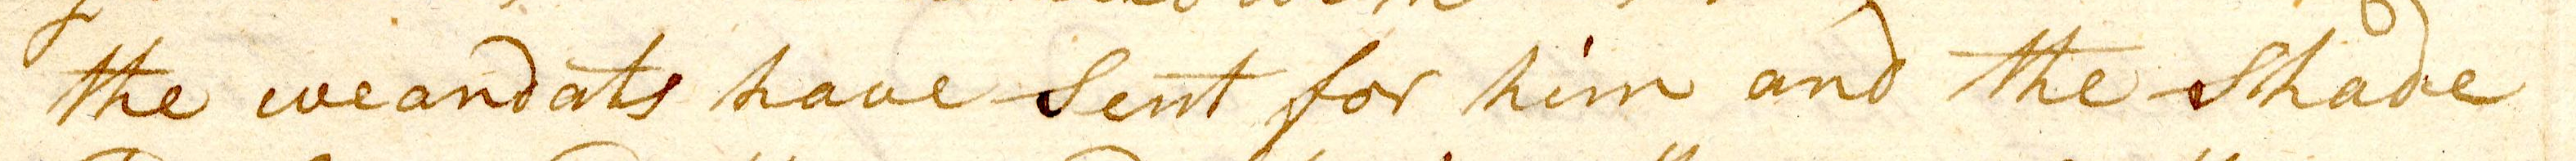the weandats have sent for him and the shade
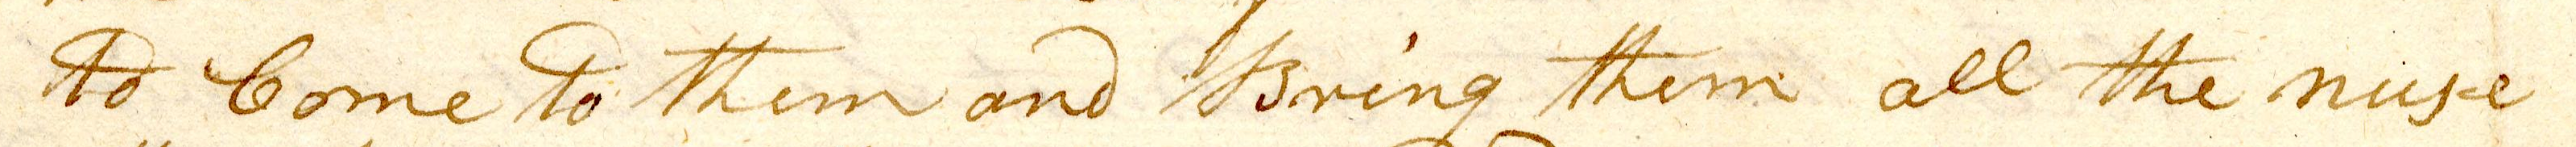to Come to them and Bring them all the nuse
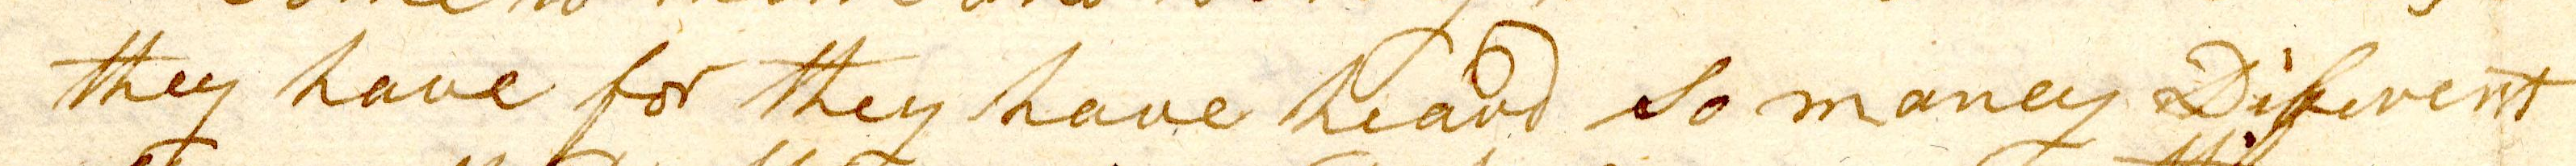they have for they have heard So maney Diferent
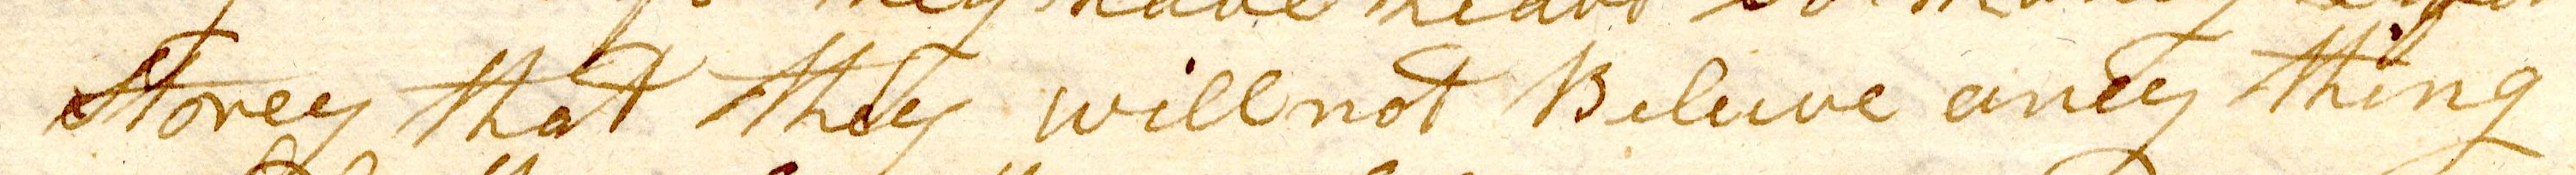storey that they will not Believe aney thing
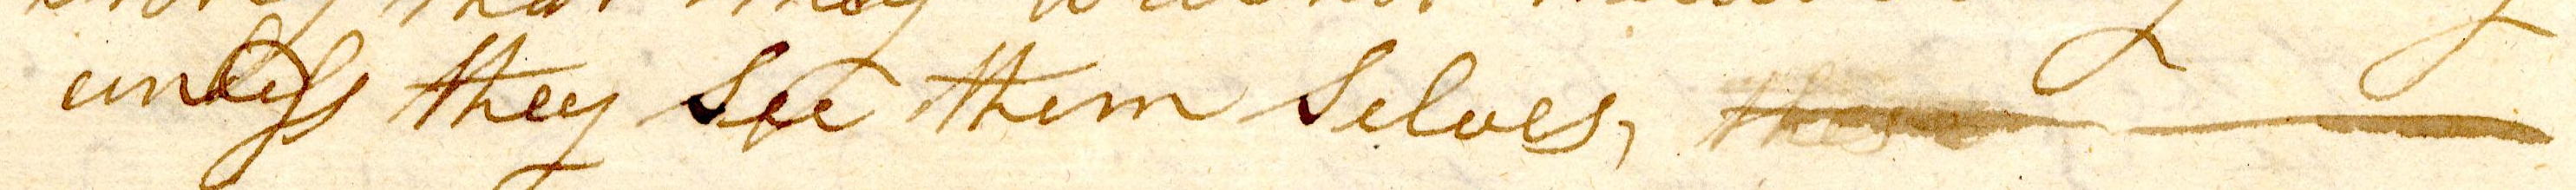unless they See them Selves,
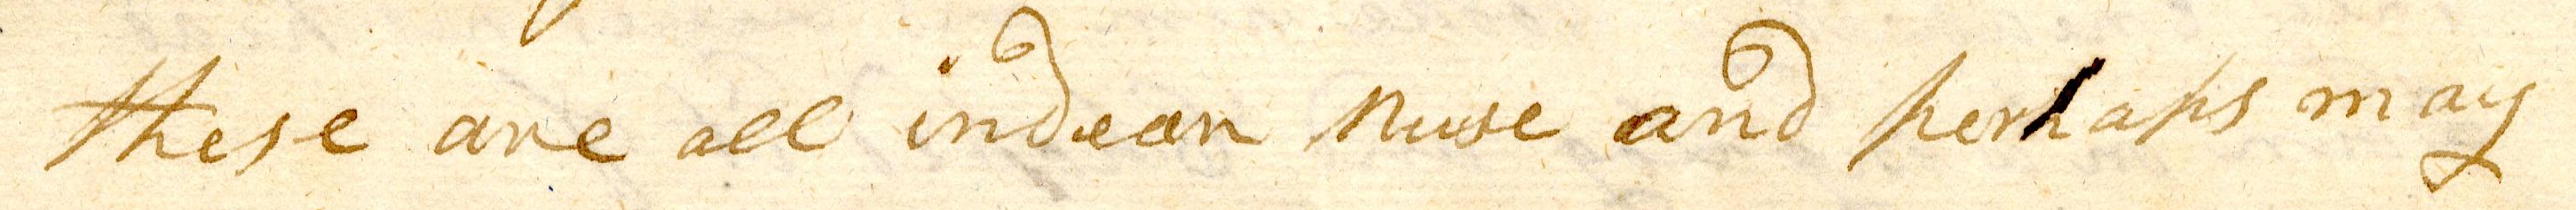these are all indean nuse and perhaps may
